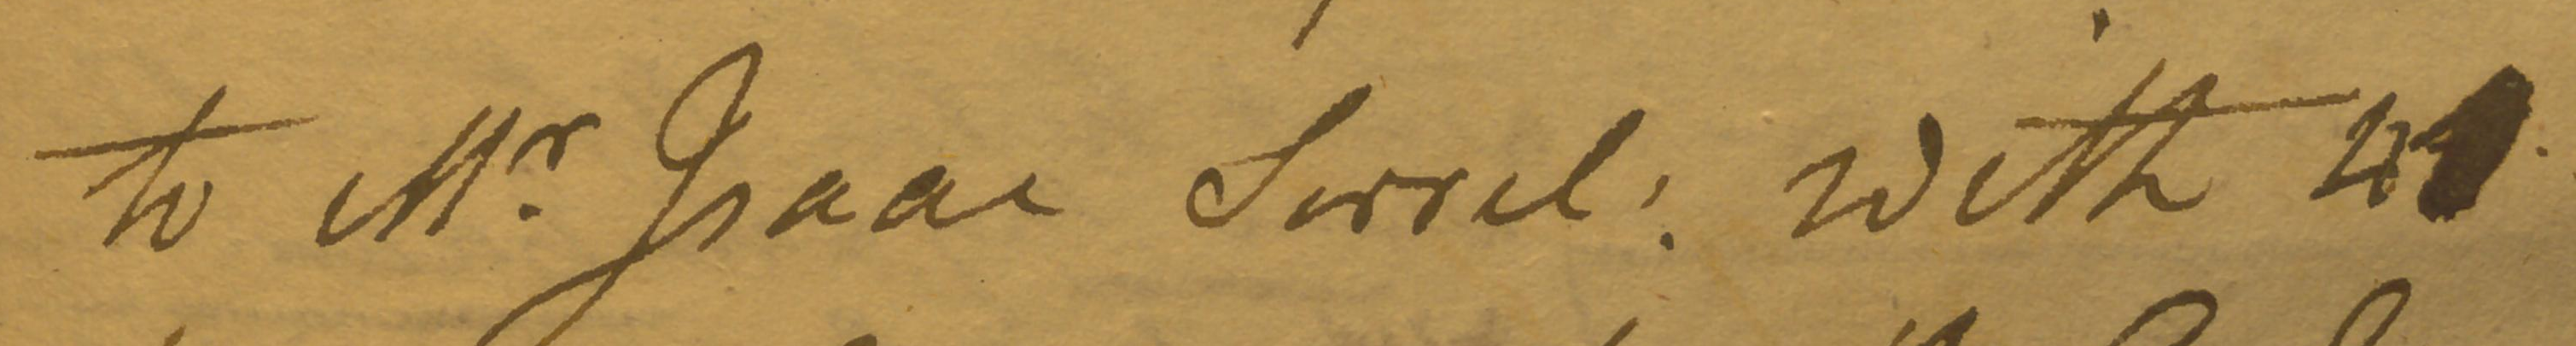to M^r. Isaac Serrel, with 41
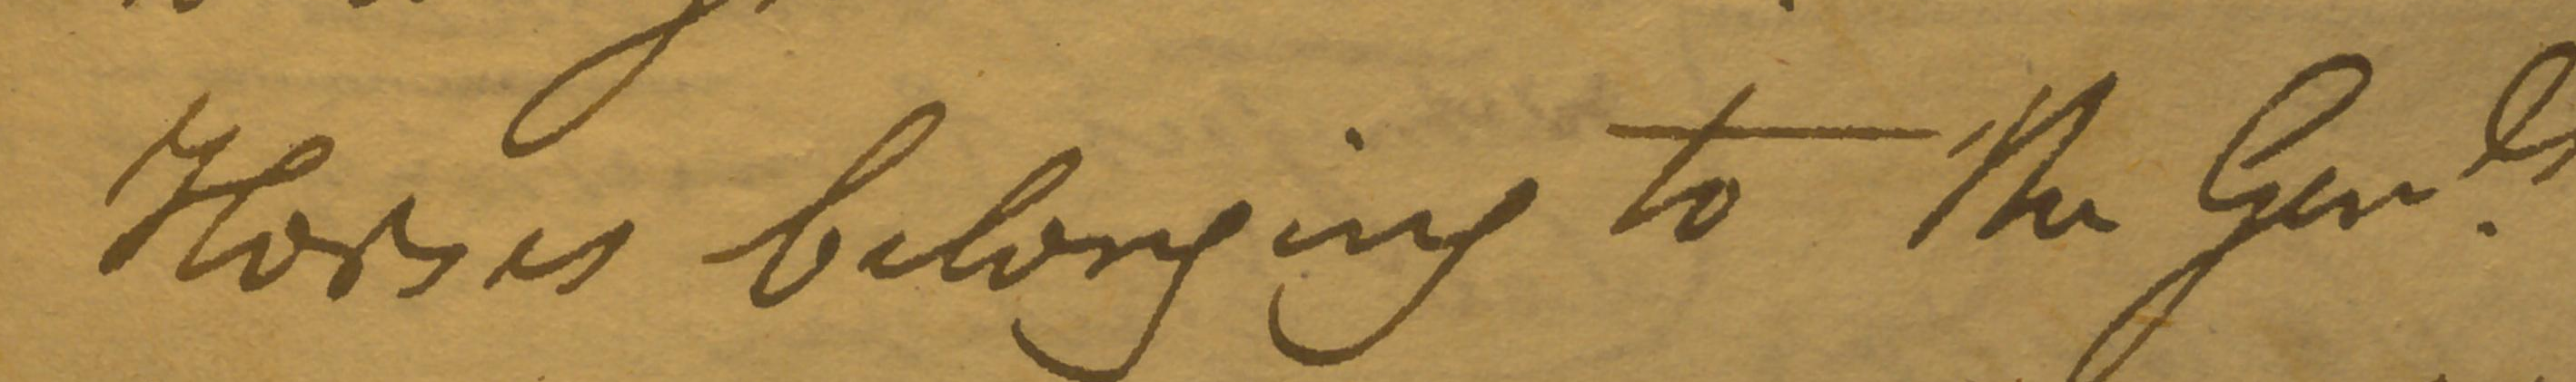Horses belonging to the Gen^l
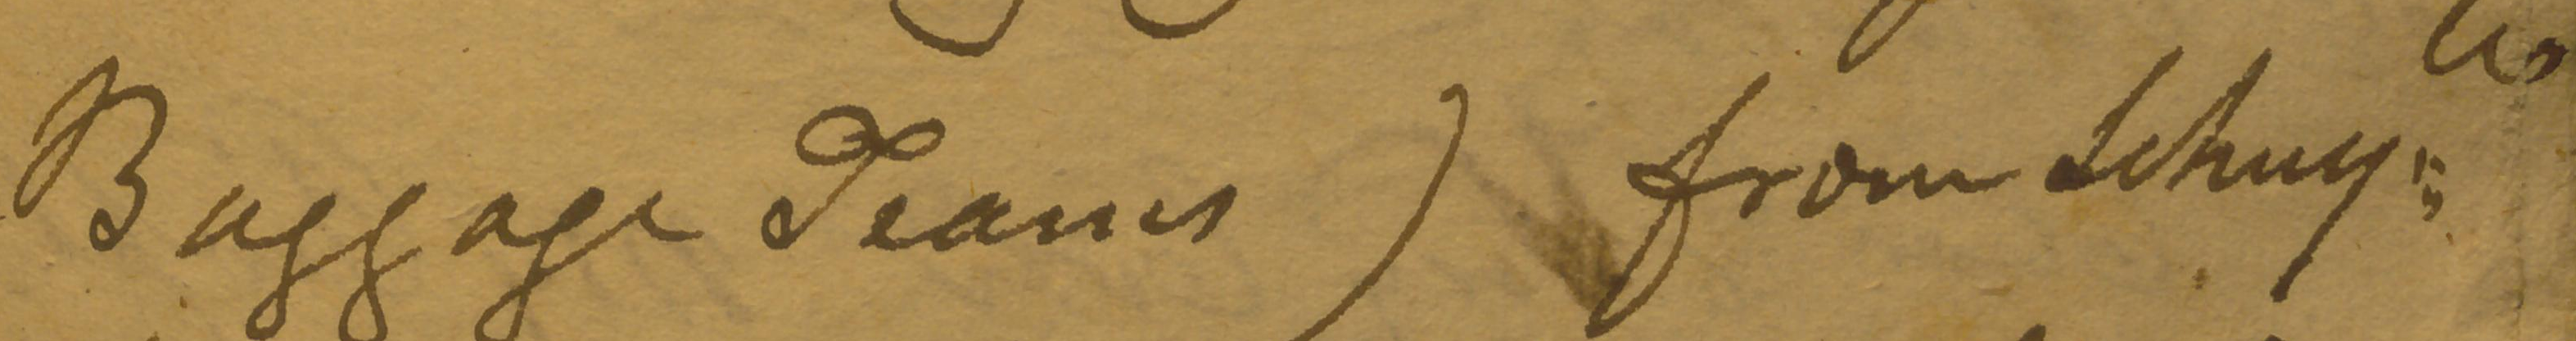Baggage Teams) from Schuy:^ll
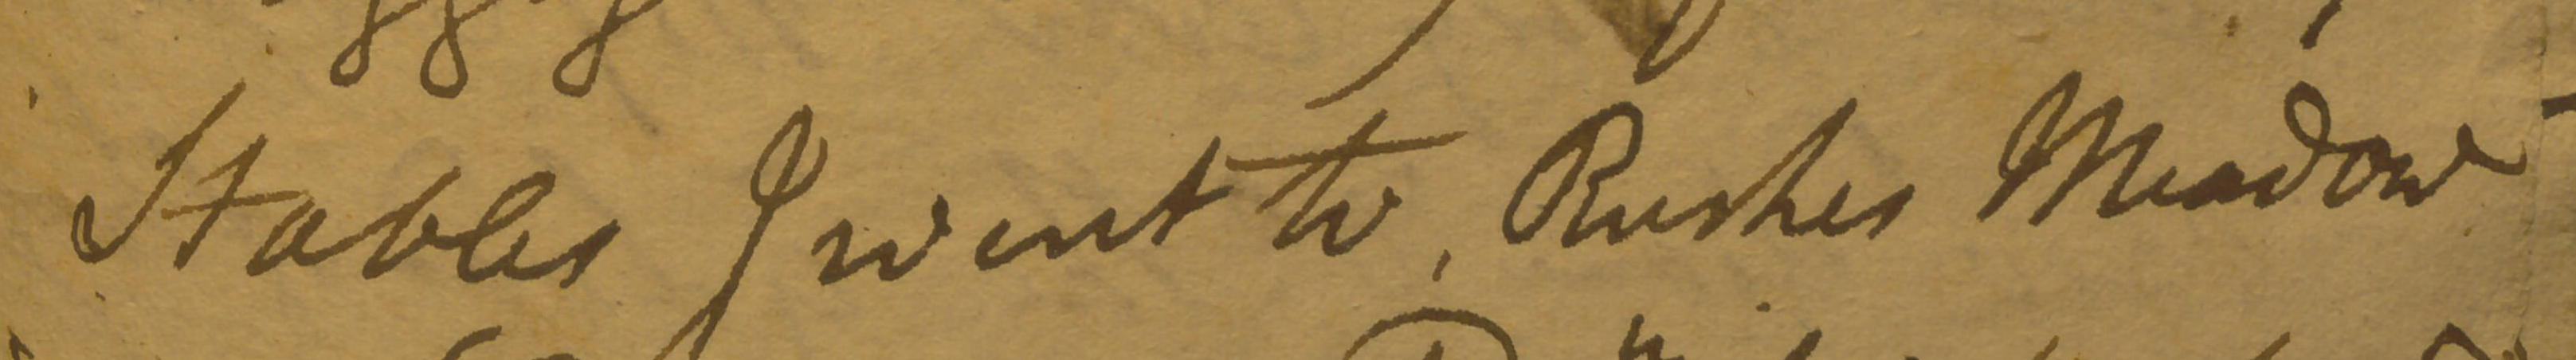Stables I went to Rushes Meadow
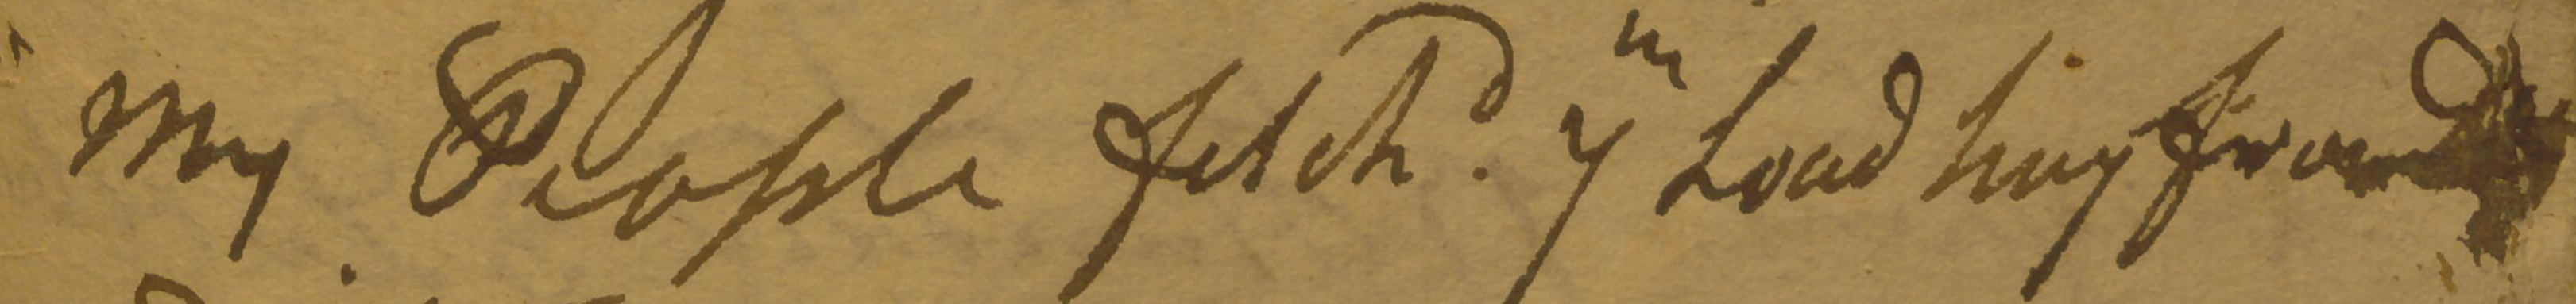my People fetch^d. 7^th Load hay from
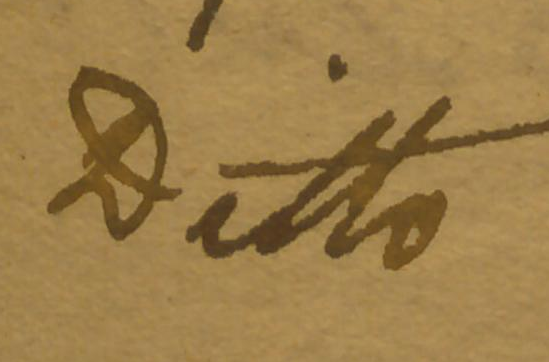Ditto
